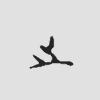之
